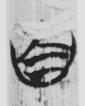自
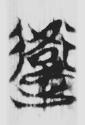{衛止}
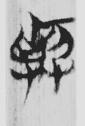與
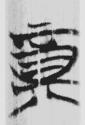奠
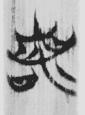若
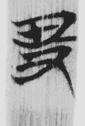卑
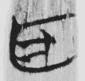耳
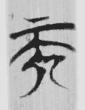而
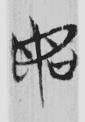{母口}
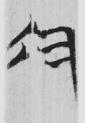今
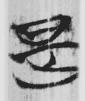是
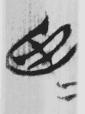臣=
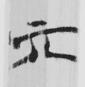亓
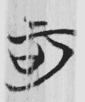可
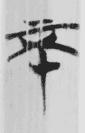不
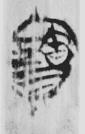寶
